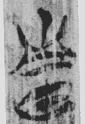青（請）
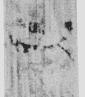又
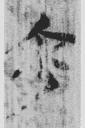{余少}（餘）
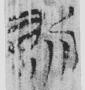則
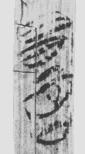詒（辭）
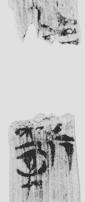新（親）
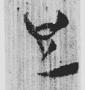也
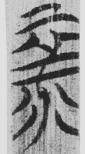彔（祿）
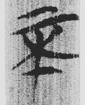不
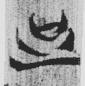足
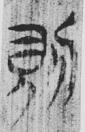則
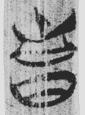青（青）
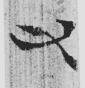又
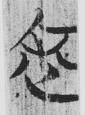{余少}（餘）
